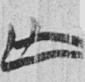亡
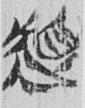道
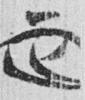正
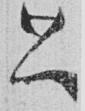也
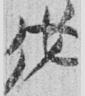伐
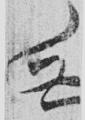厇
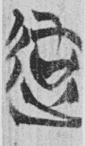适
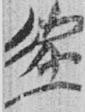○（吾）
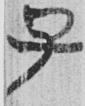子
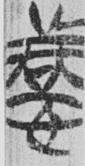○（圖）
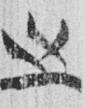之
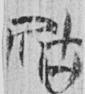姑（苦）
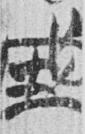○（成）
